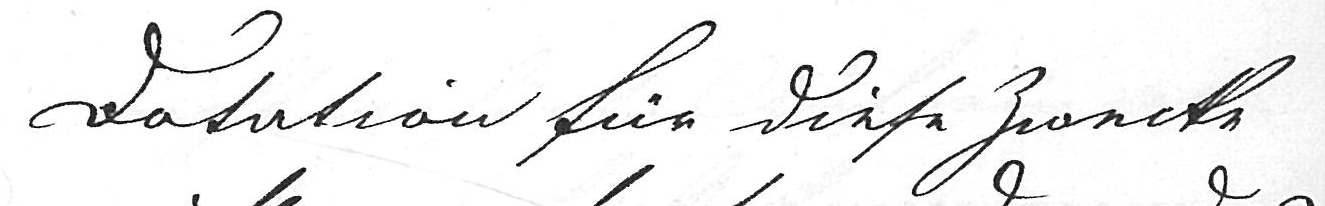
Dotation für diese Zwecke
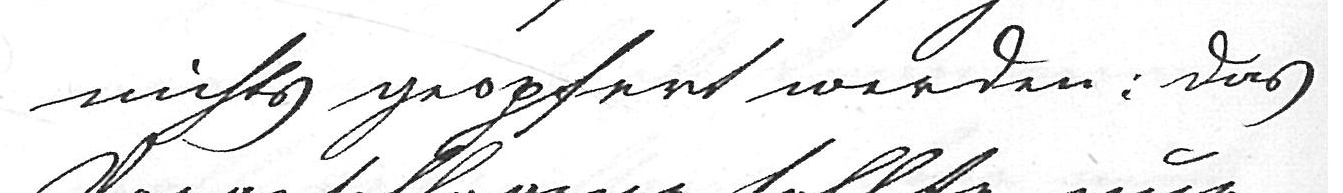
nichts geopfert werden; das
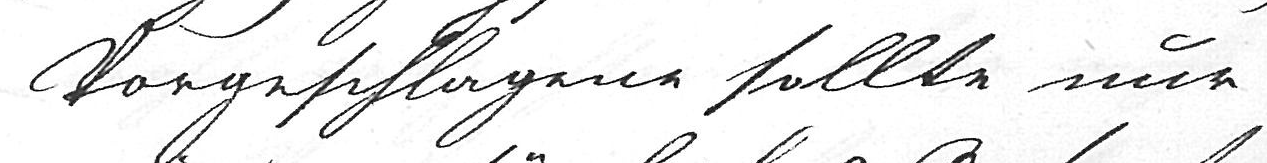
Vorgeschlagene sollte nur
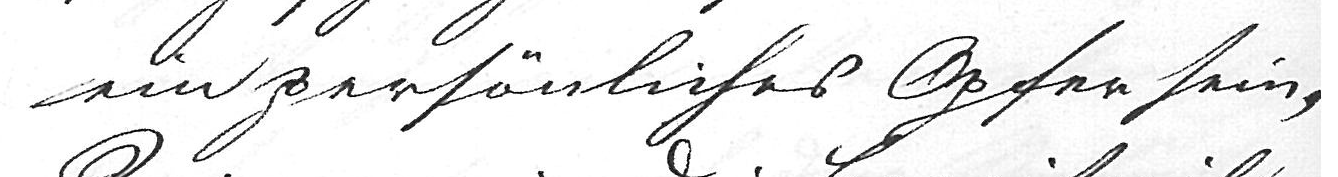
ein persönliches Opfer sein,
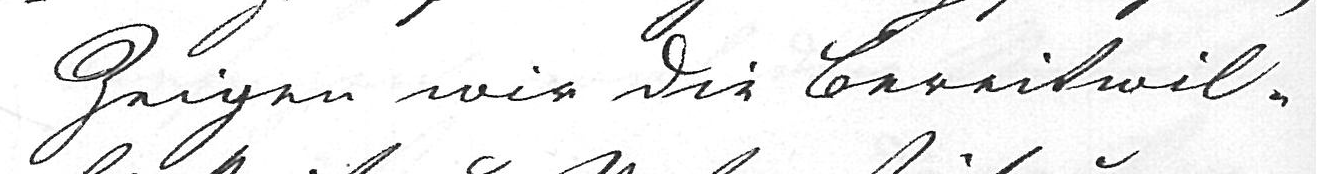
Zeigen wir die Bereitwil-
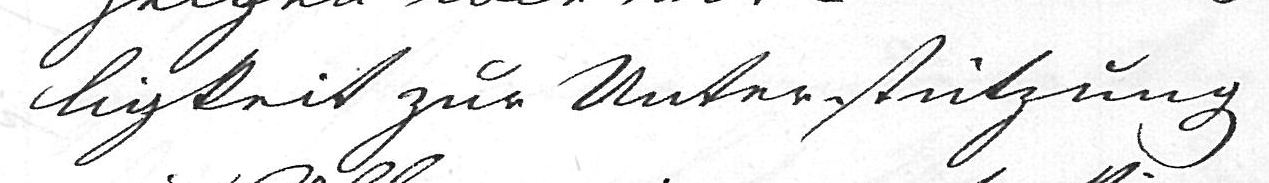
ligkeit zur Unterstützung
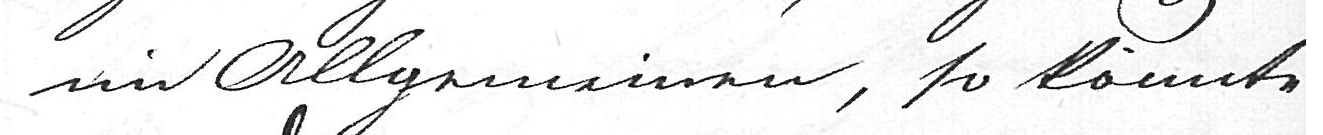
in Allgemeinen, so könnte
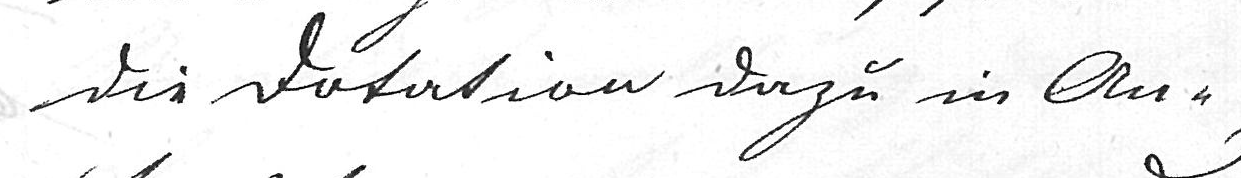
die Dotation dazu in An-
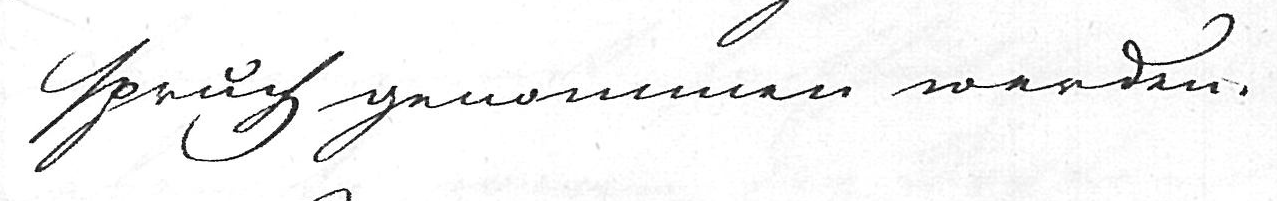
spruch genommen werden.
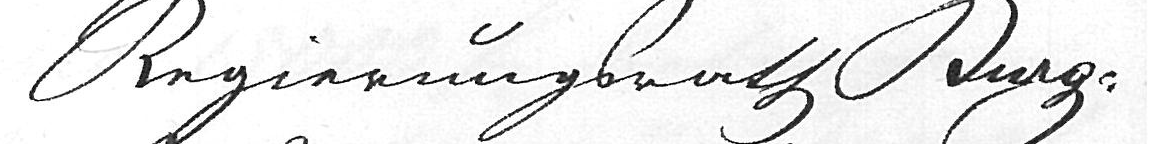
Regierungsrath Burg:
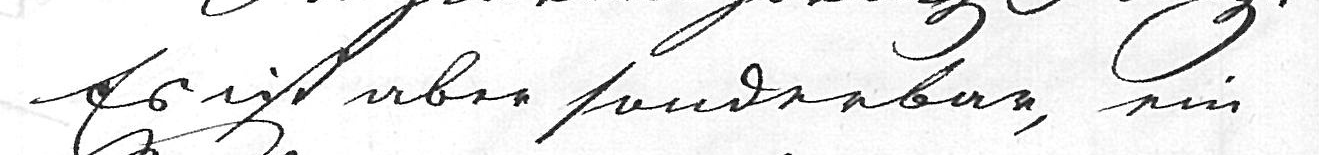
Es ist aber sonderbar, ein
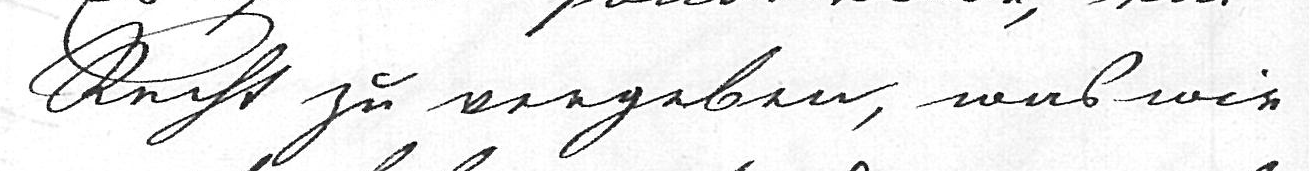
Recht zu vergeben, was wir
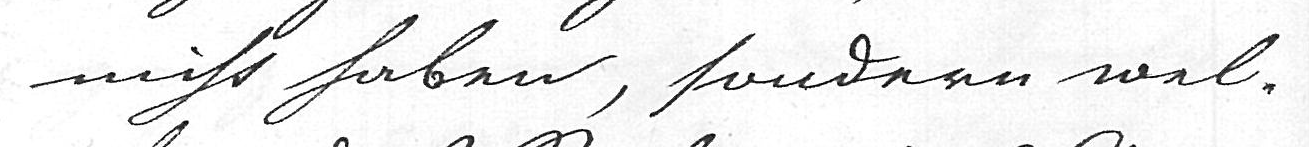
nicht haben, sondern wel-
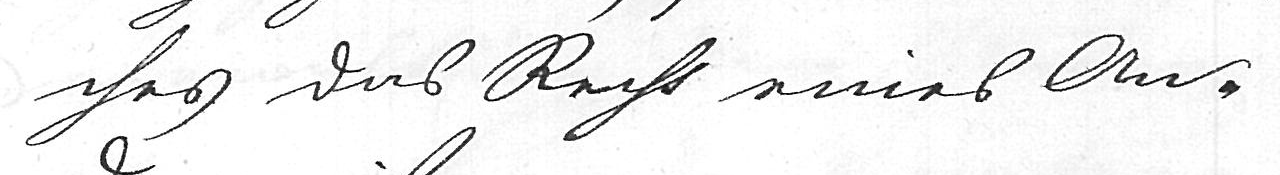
ches das Recht eines An-
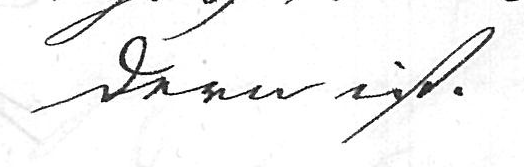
dern ist.
